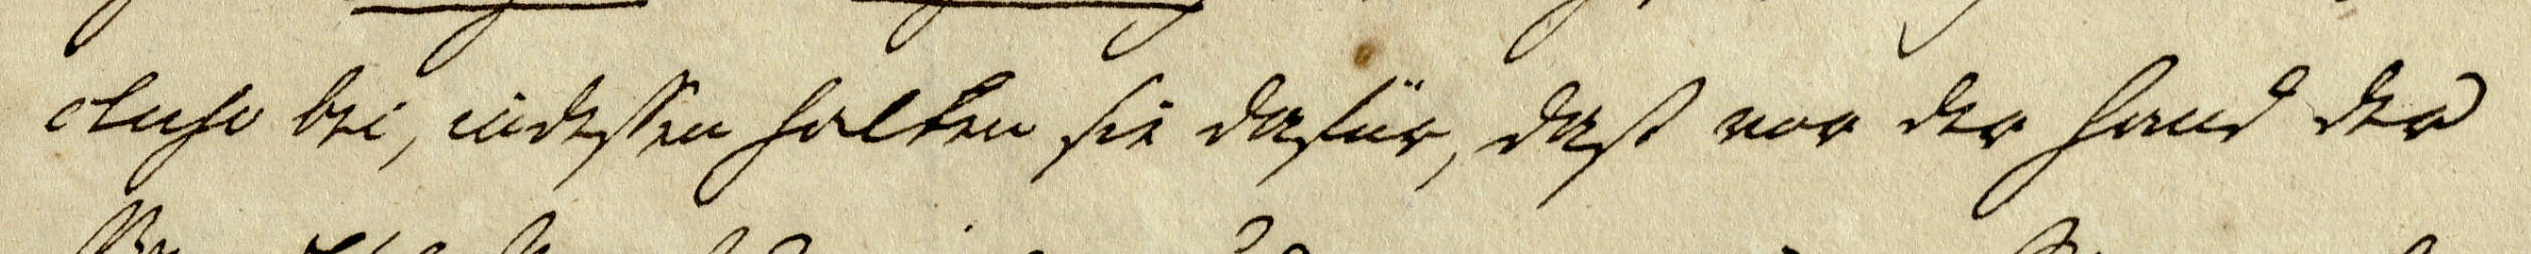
cluso bei, indessen halten sie dafür, daß vor der Hand der
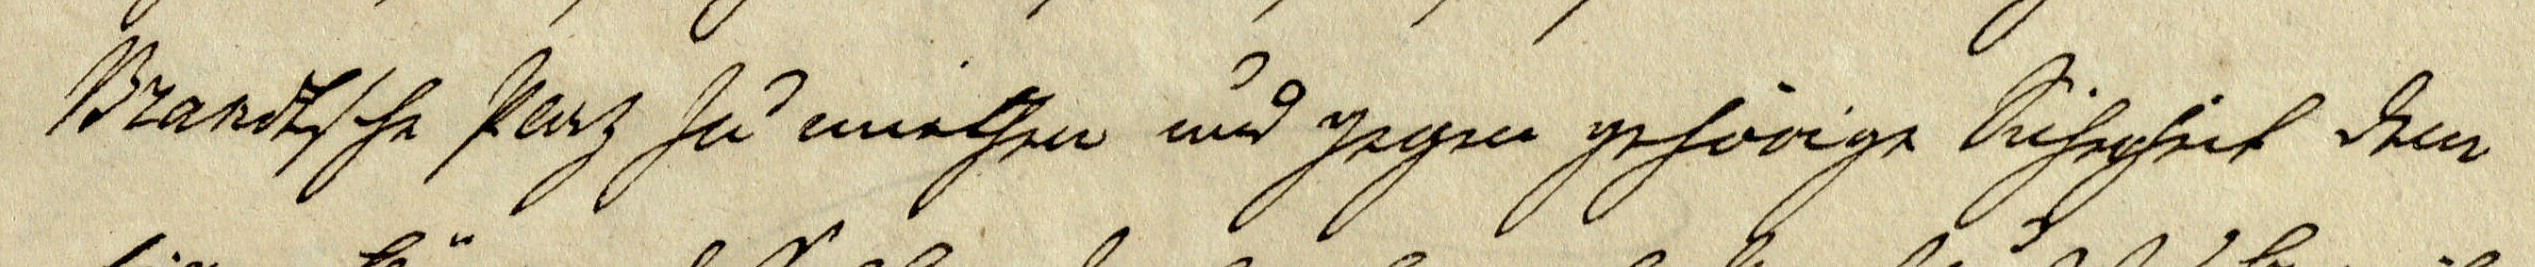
Brandtsche Platz zu miethen und gegen gehörige Sicherheit dem
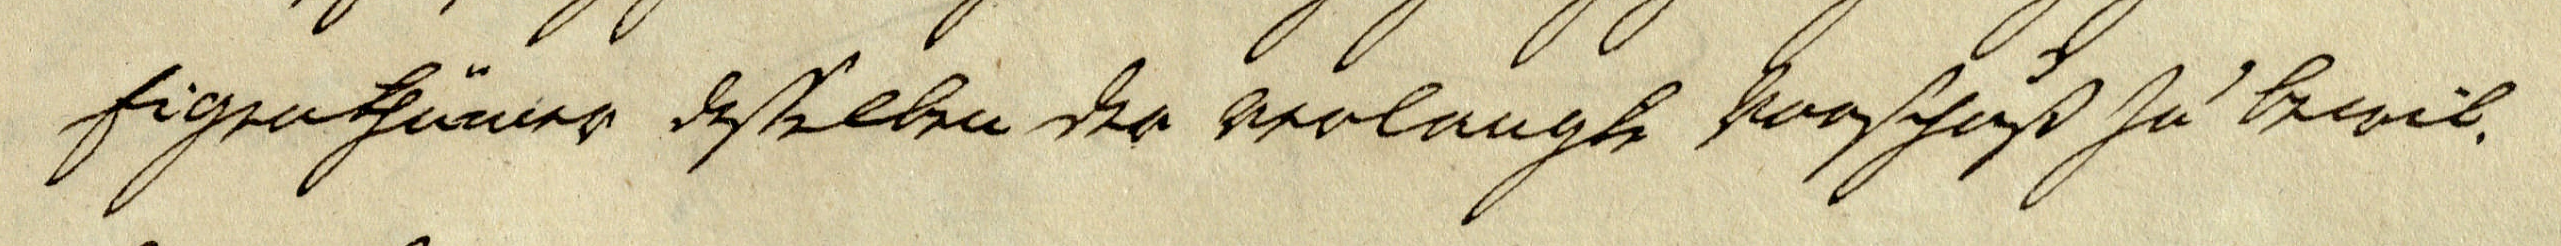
Eigenthümer desselben der verlangte Vorschuß zu bewil¬
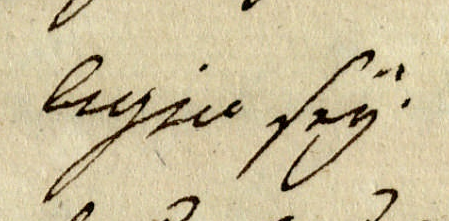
ligen seÿ.
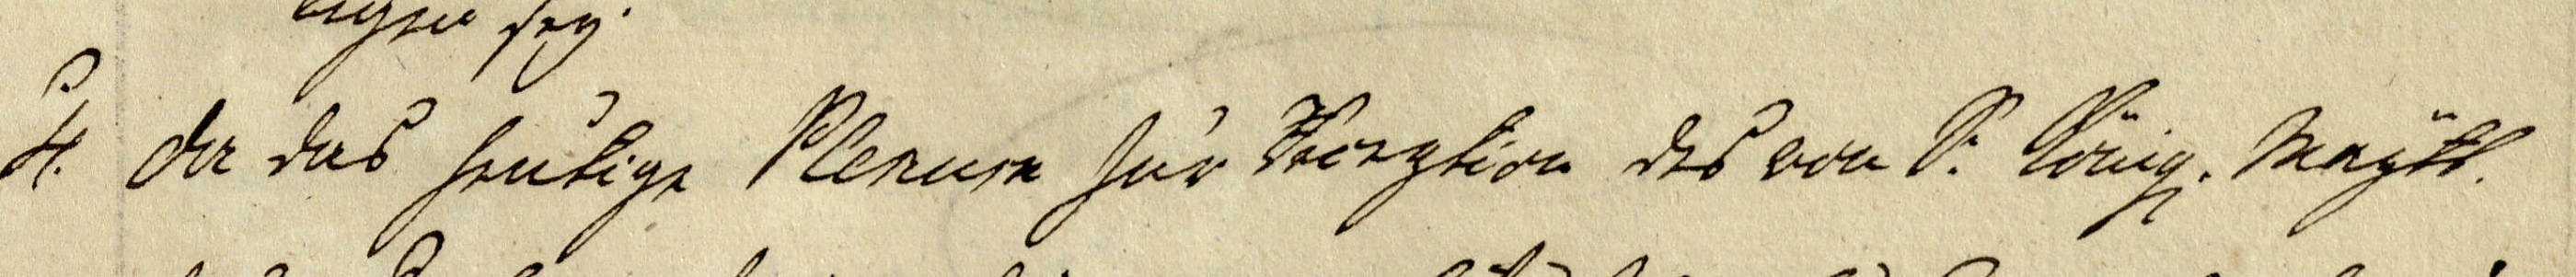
4. Da das heutige Plenum zur Reception des von S. König. Maÿtt.
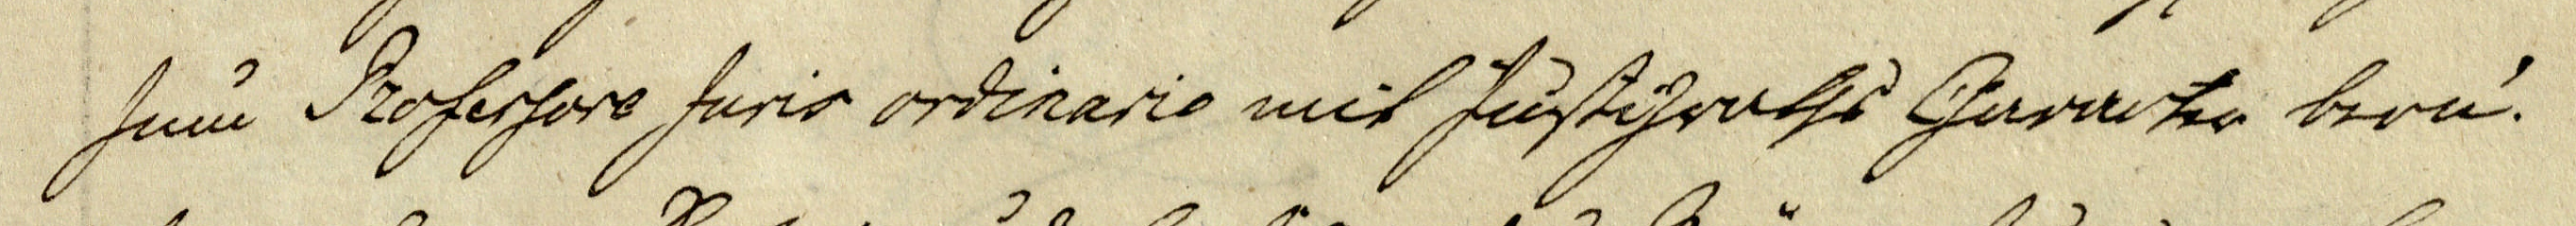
zum Professore Juris ordinario mit Justizraths Character beru¬
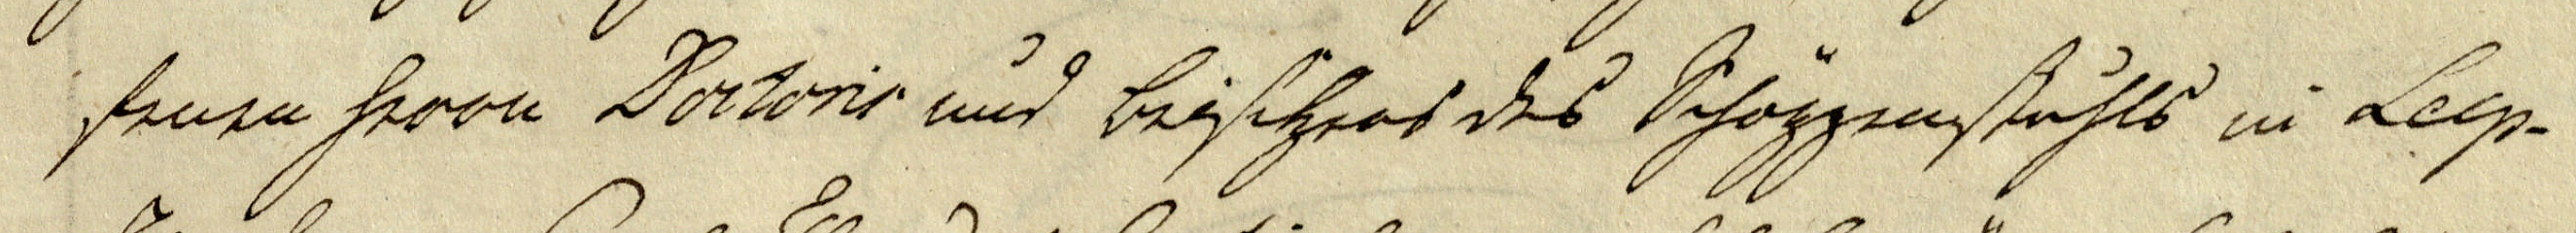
fenen Herrn Doctoris und Beisitzers des Schöppenstuhls in Leip¬
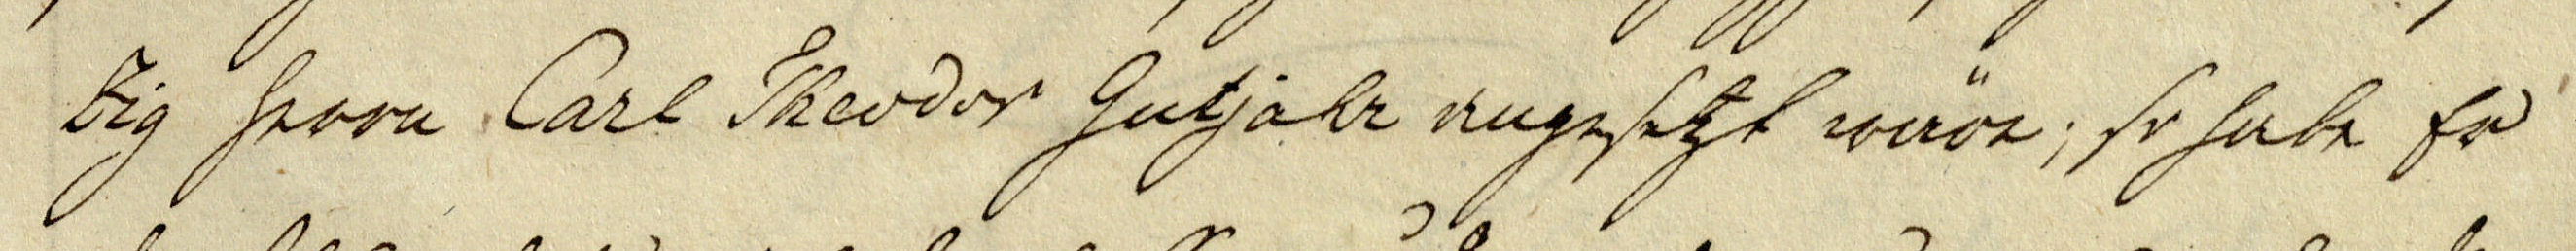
zig Herrn Carl Theodor Gutjahr angesetzt wäre; so habe Er
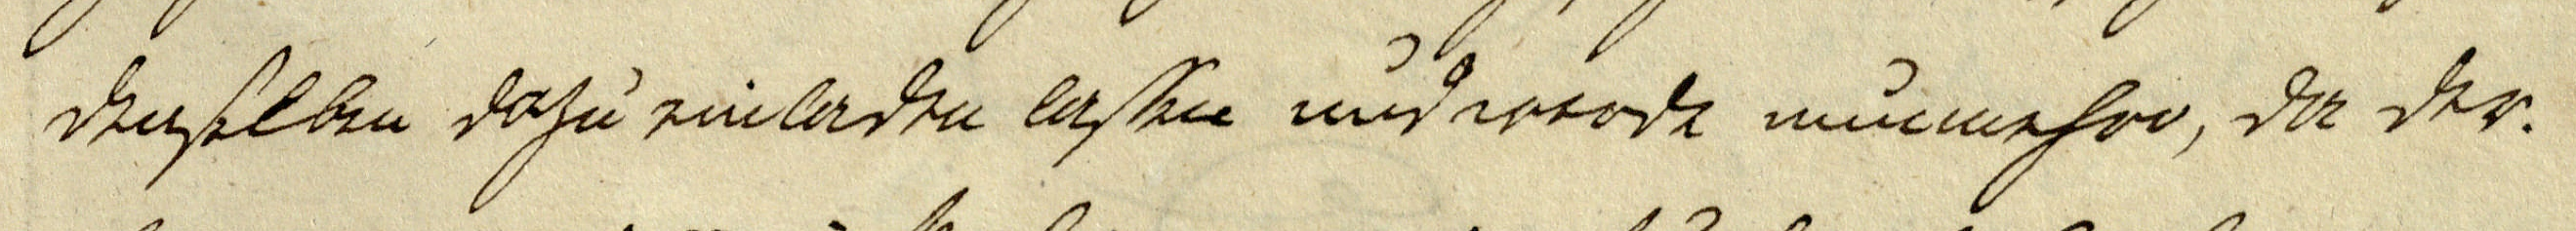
denselben dazu einladen lassen und werde nunmehro, da der¬
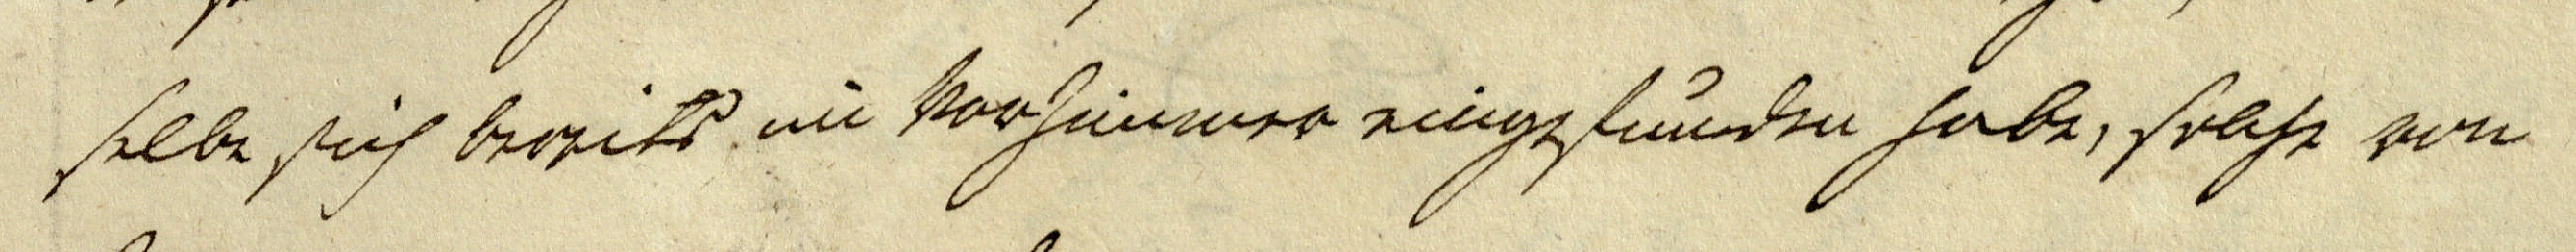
selbe sich bereits im Vorzimmer eingefunden habe, solche von
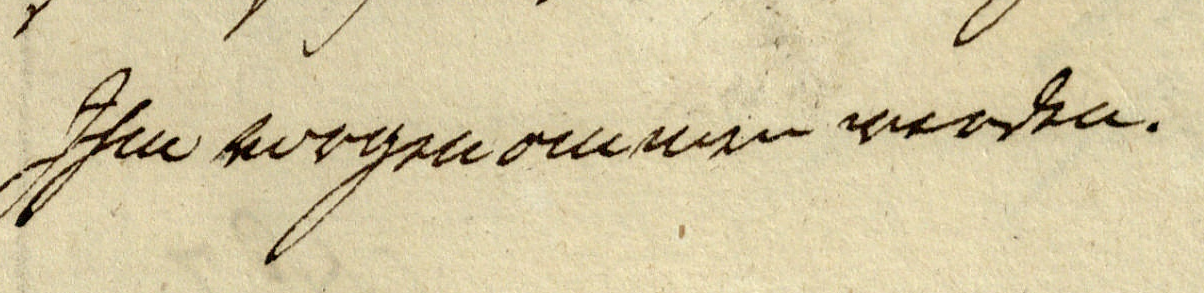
Ihm vorgenommen werden.
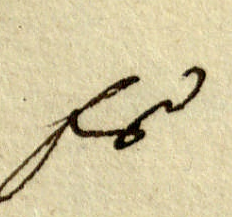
Es
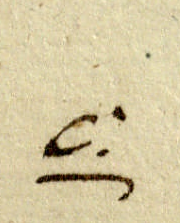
c.
